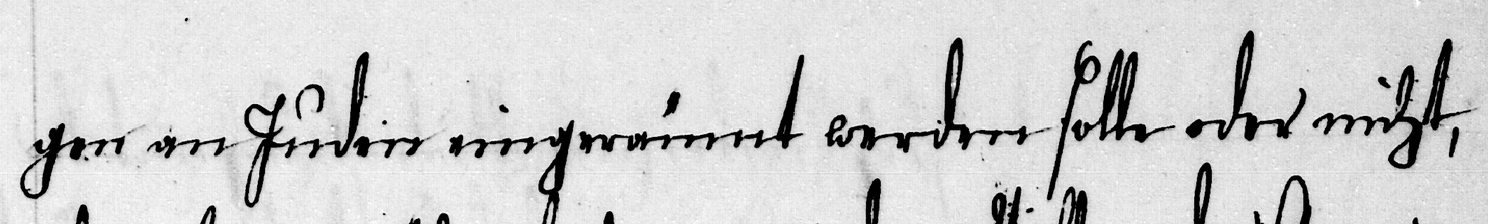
gen an Juden eingeräumt werden solle oder nicht,
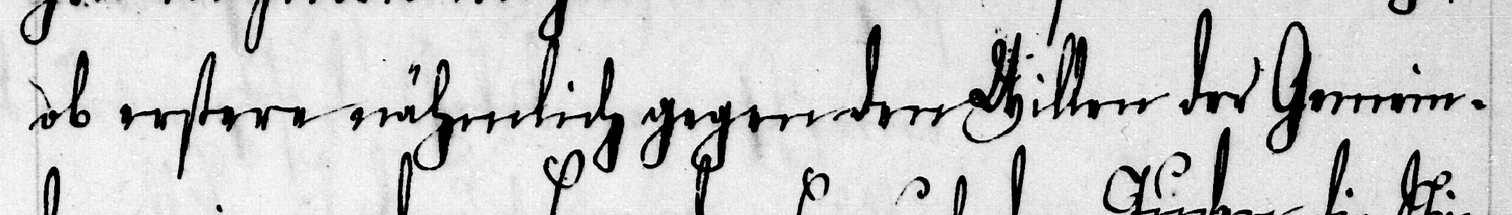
ob erstere nähmlich gegen den Willen der Gemein¬
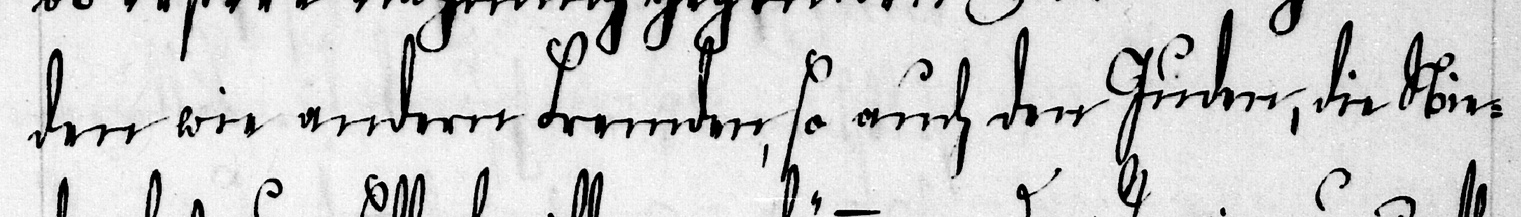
den wie andern Fremden, so auch den Juden, die Nie¬
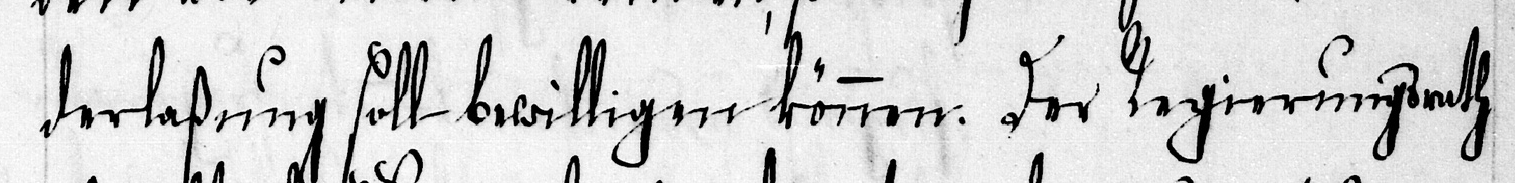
derlaßung soll bewilligen können. Der Regierungsrath
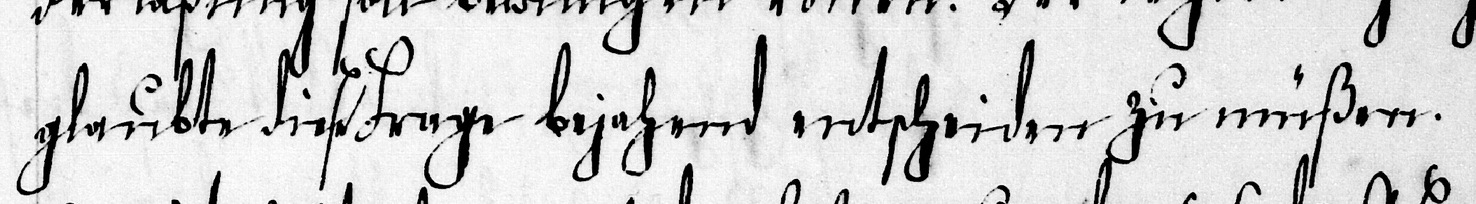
glaubte diese Frage bejahend entscheiden zu müßen.
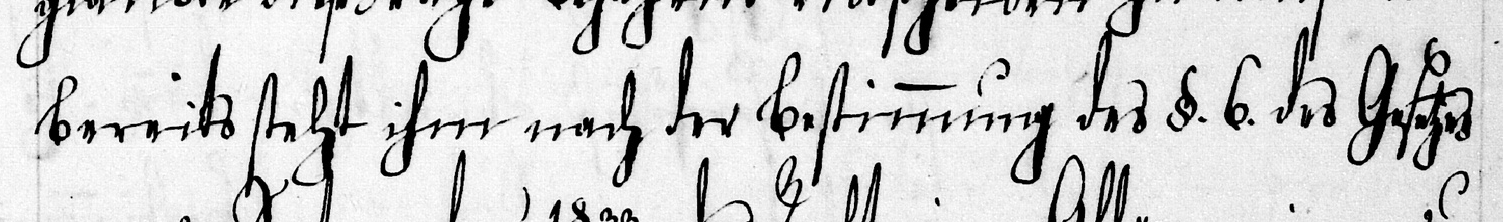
Bereits steht ihm nach der Bestimmung des §. 6. des Gesetz¬
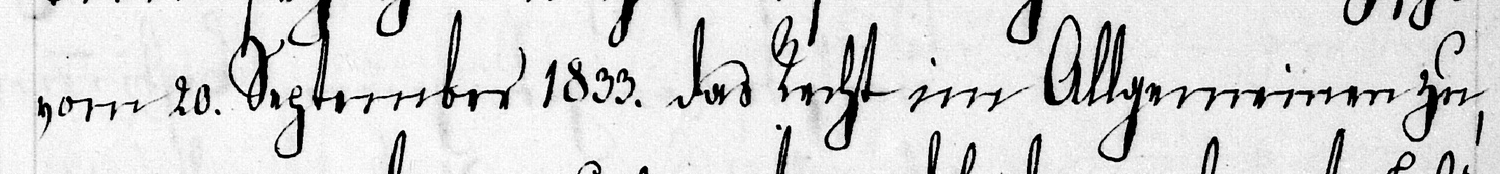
vom 20. September 1833. das Recht im Allgemeinen zu,
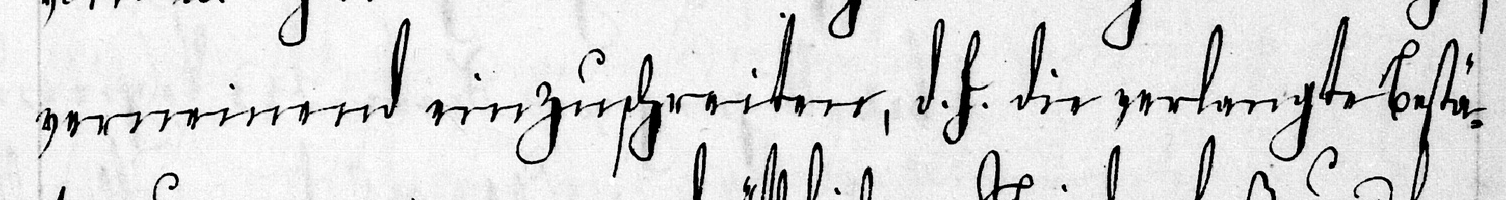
verneinend einzuschreiten, d. h. die verlangte Bestä¬
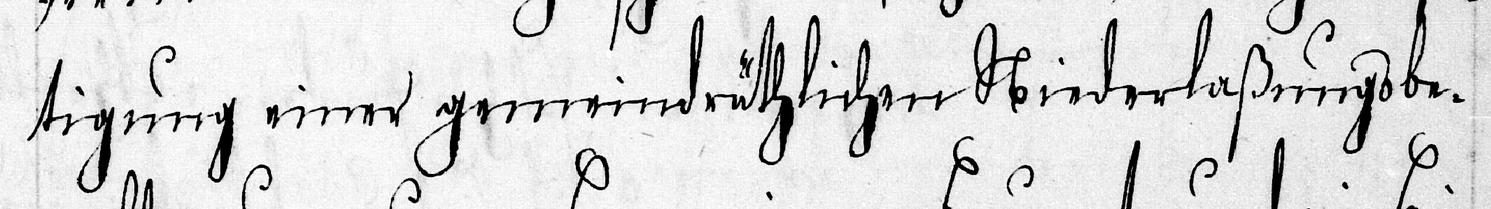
tigung einer gemeindräthlichen Niederlaßungsbe¬
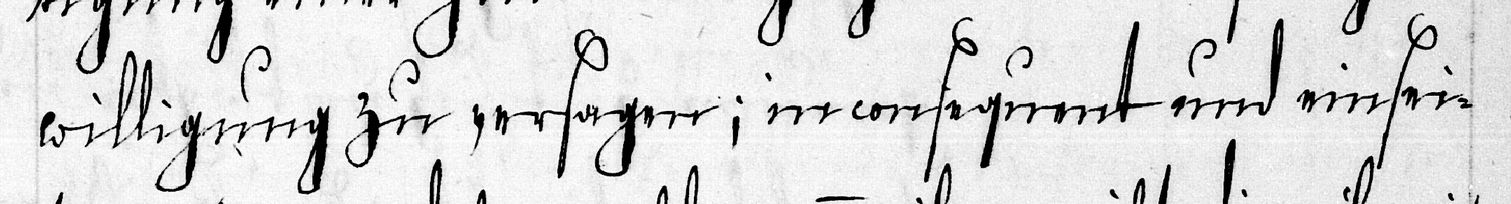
willigung zu versagen; inconsequent und einsei¬
